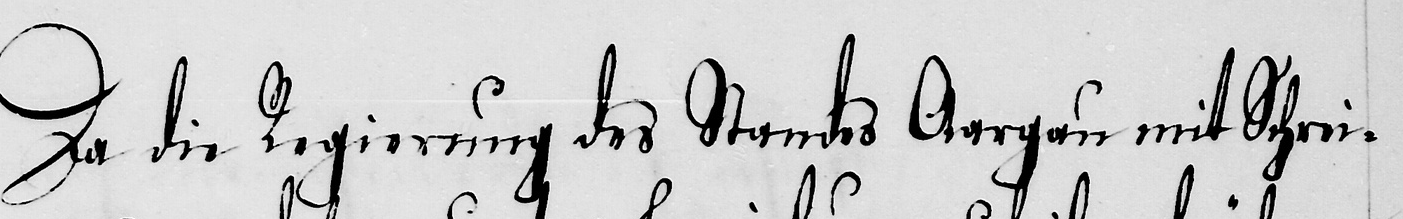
Da die Regierung des Standes Aargau mit Schrei¬
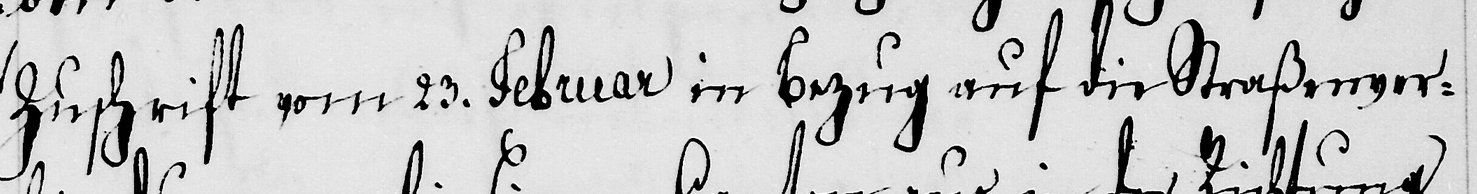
Zuschrift vom 23. Februar in Bezug auf die Straßenver¬
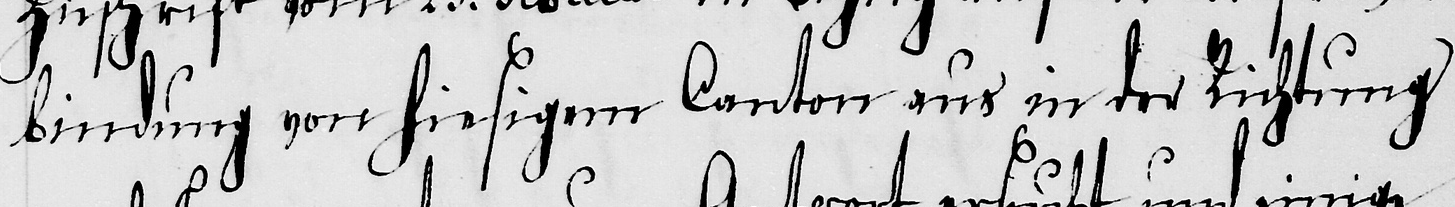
bindung von hiesigem Canton aus in der Richtung
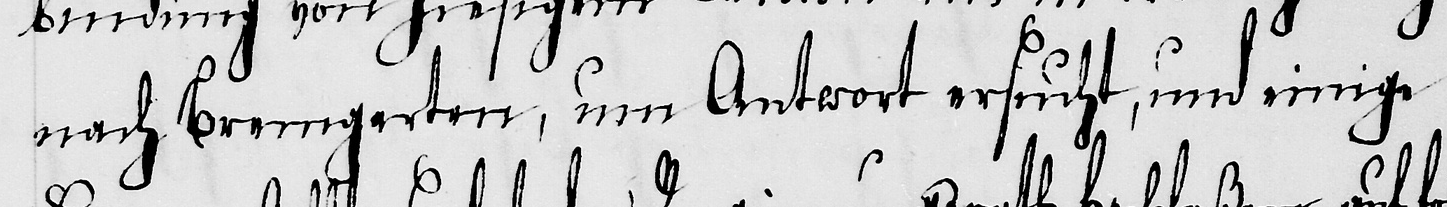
nach Bremgarten, um Antwort ersucht, und einige
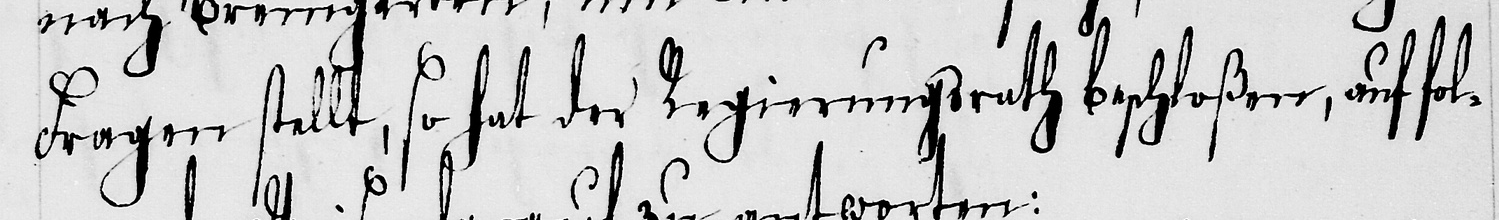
stellt, so hat der Regierungsrath beschloßen, auf fo¬
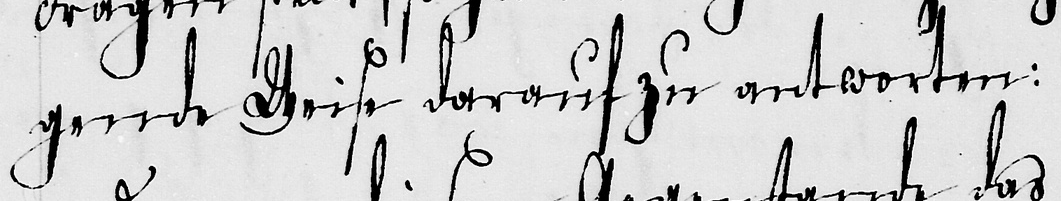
lgende Weise darauf zu antworten:
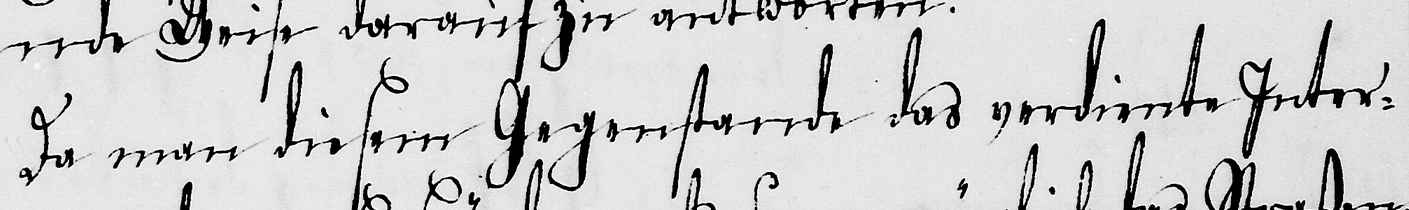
Da man diesem Gegenstande das verdiente Inter¬
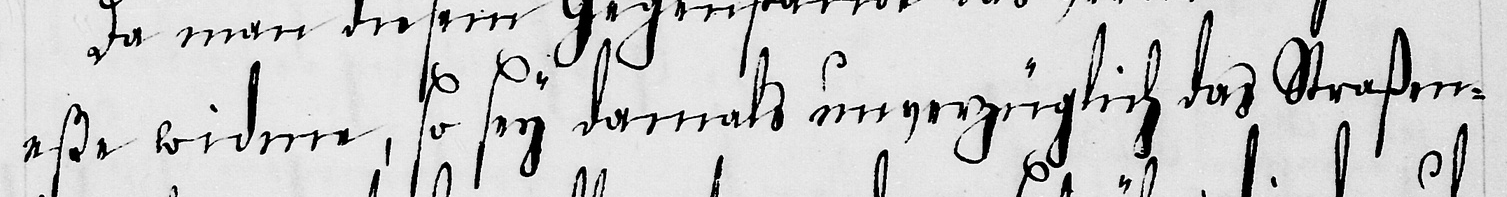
eße widme, so sey damals unverzüglich das Straßen¬
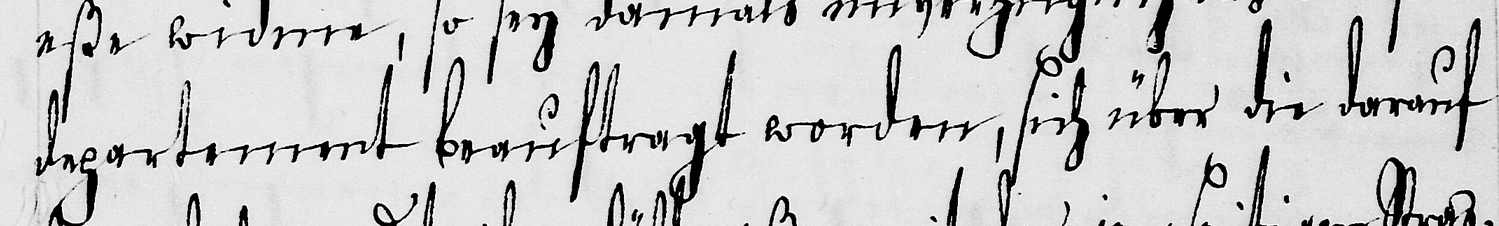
departement beauftragt worden, sich über die darauf
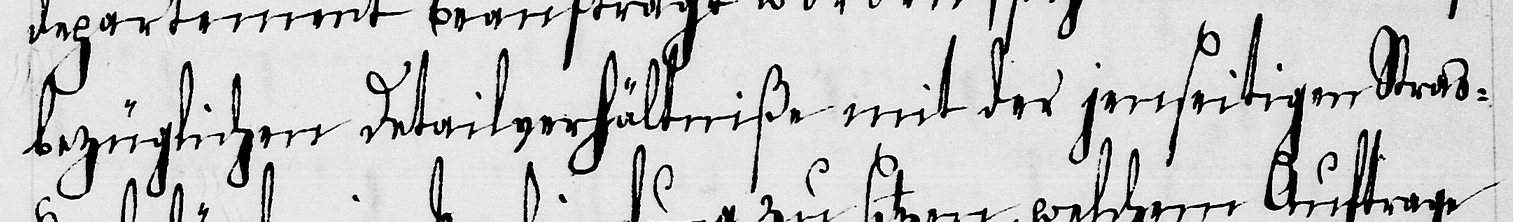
bezüglichen Detailverhältniße mit der jenseitigen Straß¬
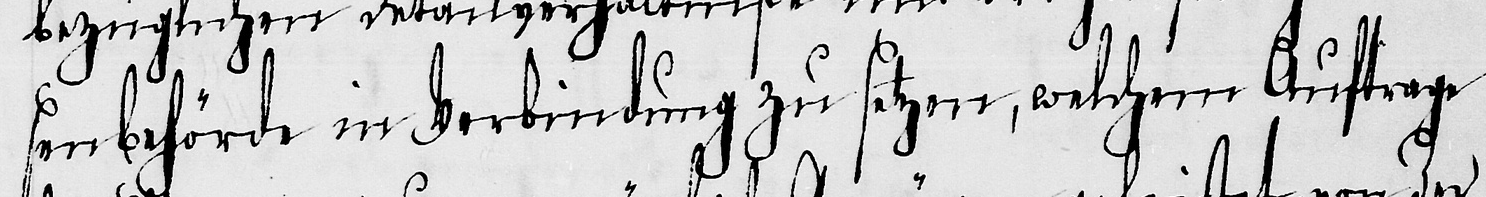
enbehörde in Verbindung zu setzen, welchem Auftrage
